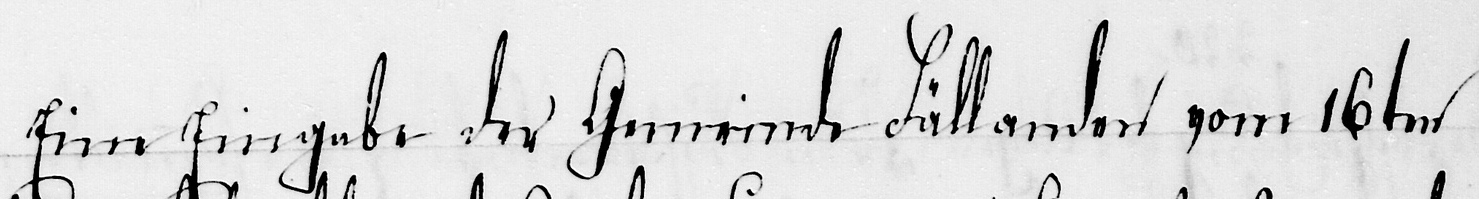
Eine Eingabe der Gemeinde Fällanden vom 16ten
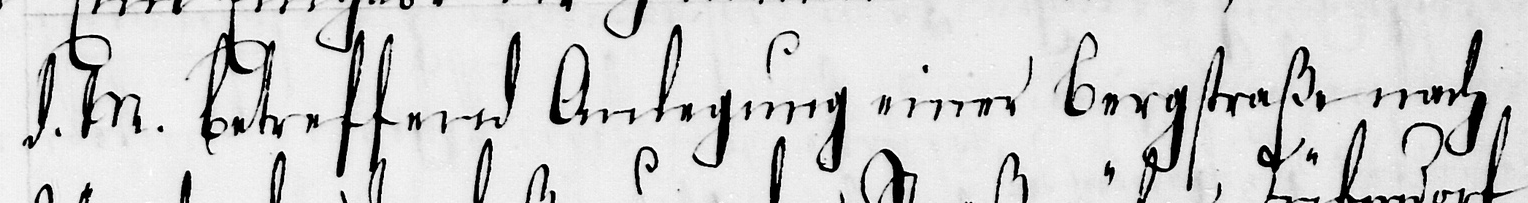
d. M. betreffend Anlegung einer Bergstraße nach
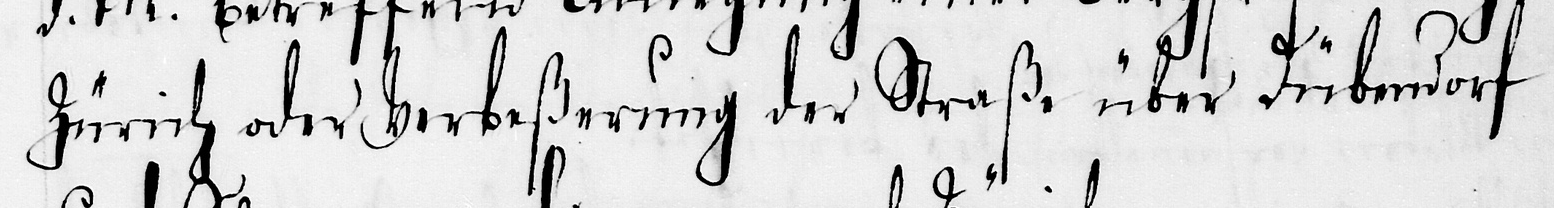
Zürich oder Verbeßerung der Straße über Dübendorf
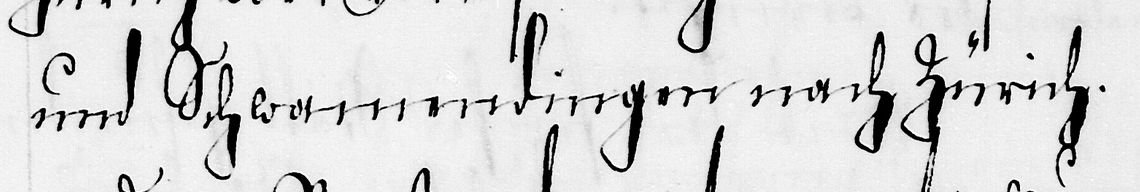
und Schwamendingen nach Zürich.
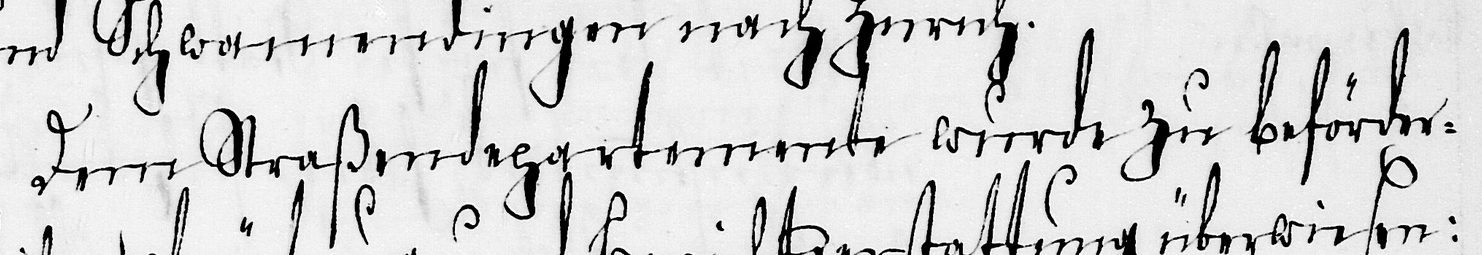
Dem Straßendepartemente wurde zu beförder¬
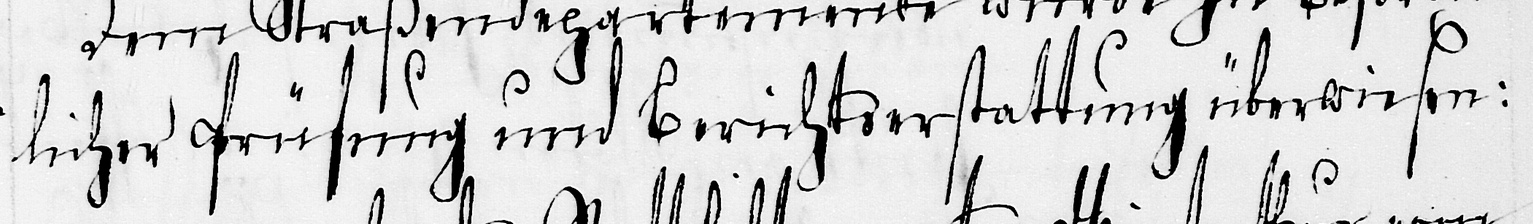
licher Prüfung und Berichtserstattung überwiesen:
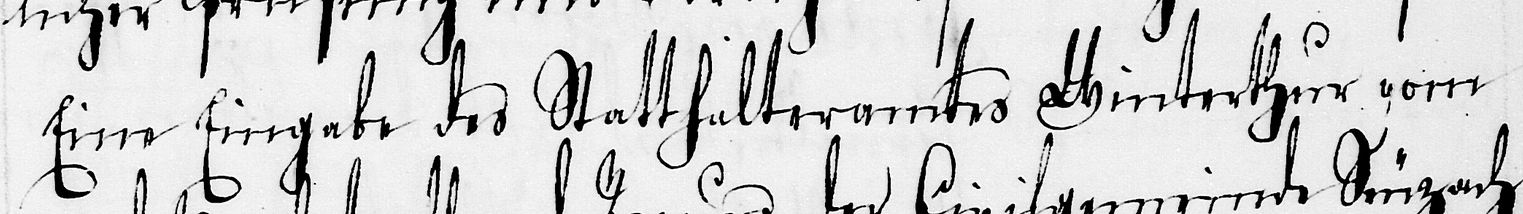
Eine Eingabe des Statthalteramtes Winterthur vom
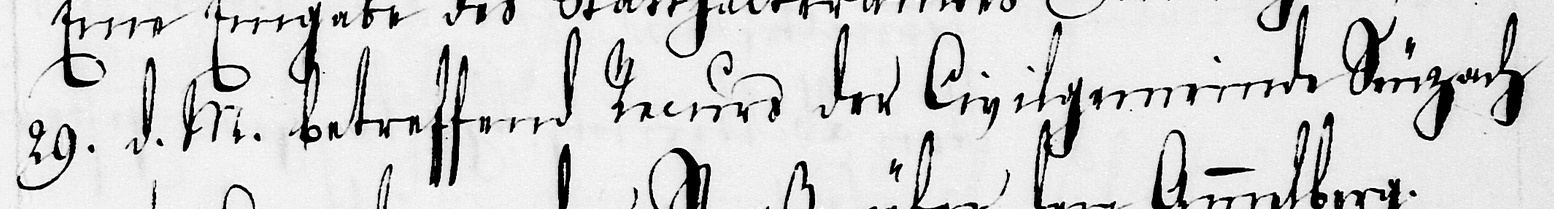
29. d. M. betreffend Recurs der Civilgemeinde Seuzach
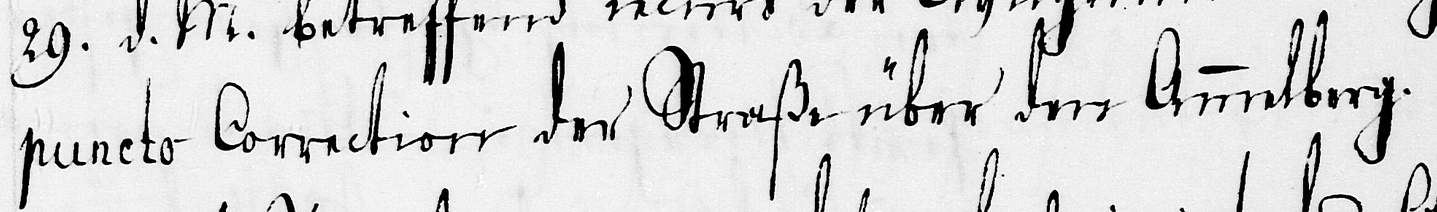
puncto Correction der Straße über den Ammelberg.
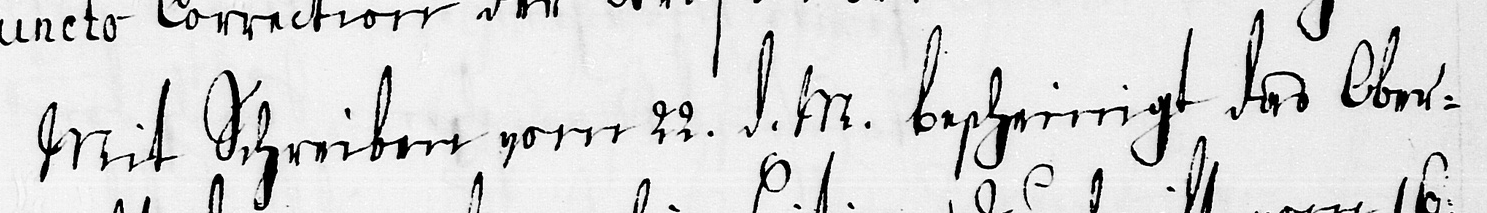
Mit Schreiben vom 22. d. M. bescheinigt das Ober¬
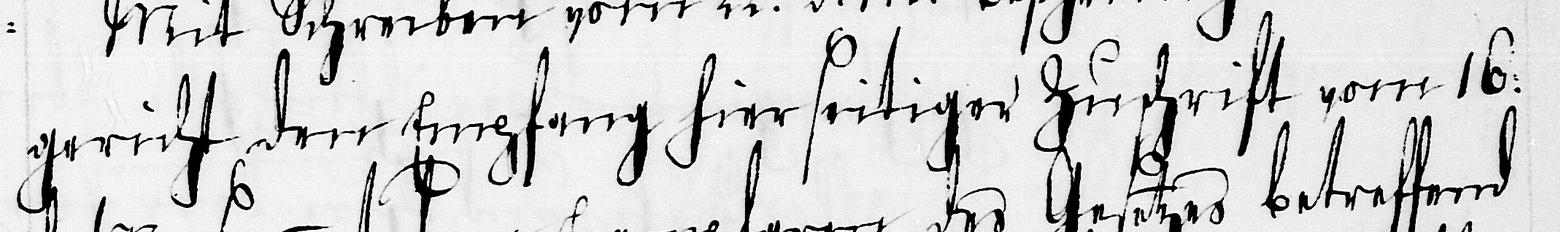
gericht den Empfang hierseitiger Zuschrift vom 16.
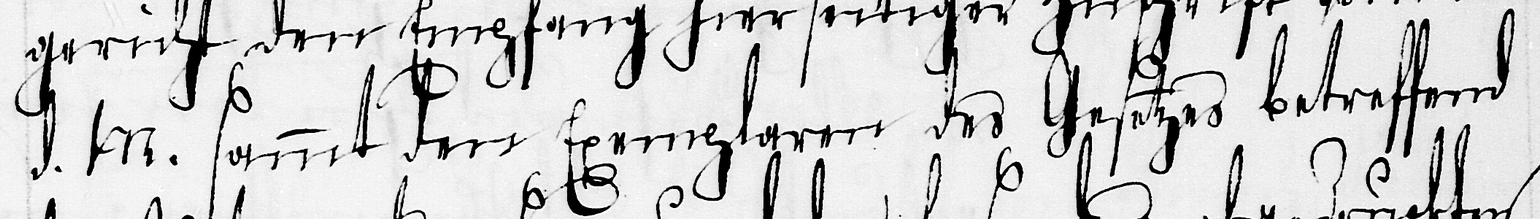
d. M. sammt den Exemplaren des Gesetzes betreffend
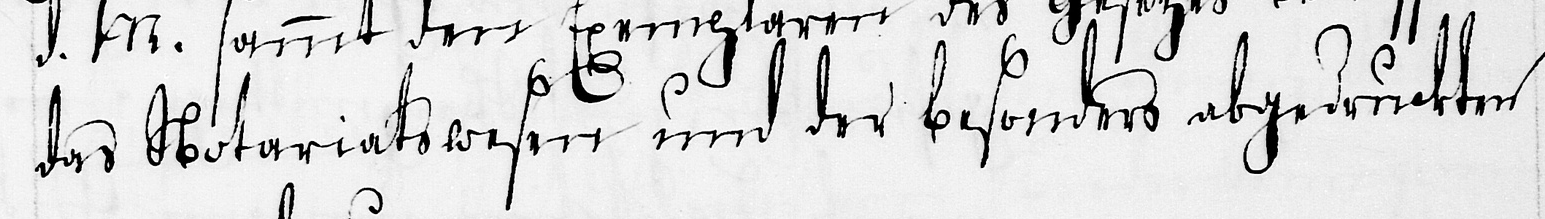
das Notariatswesen und der besonders abgedruckten
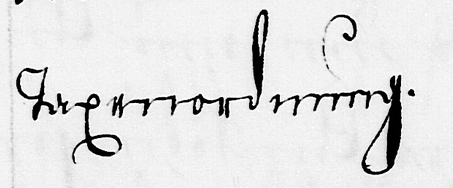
Taxenordnung.
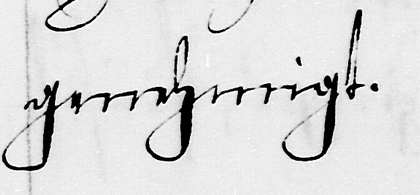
genehmigt.
